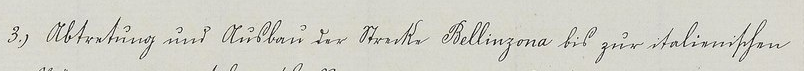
3.) Abtretung und Ausbau der Strecke Bellinzona bis zur italienischen
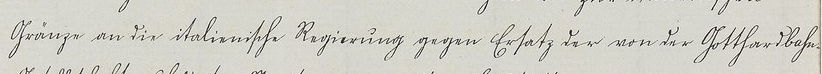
Gränze an die italienische Regierung gegen Ersatz der von der Gotthardbahn-
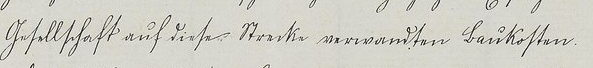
Gesellschaft auf diese Strecke verwandten Baukosten.
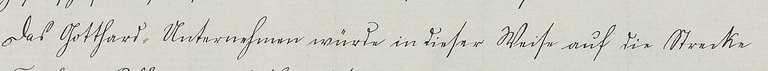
Das Gotthard-Unternehmen würde in dieser Weise auf die Strecke
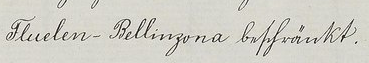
Fluelen–Bellinzona beschränkt.
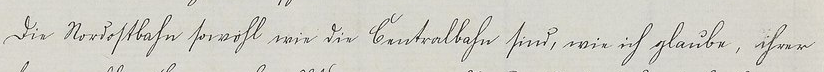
Die Nordostbahn sowohl wie die Centralbahn sind, wie ich glaube, ihrer
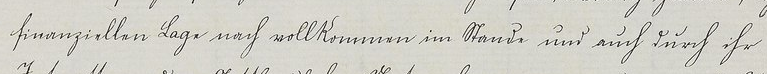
finanziellen Lage nach vollkommen im Stande und auch durch ihr
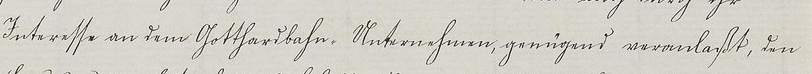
Interesse an dem Gotthardbahn-Unternehmen, genügend veranlaßt, den
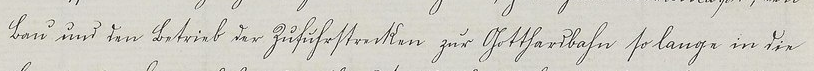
Bau und den Betrieb der Zufuhrstrecken zur Gotthardbahn so lange in die
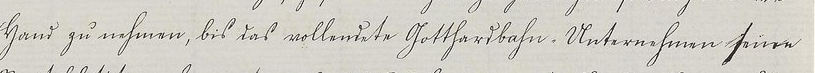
Hand zu nehmen, bis das vollendete Gotthardbahn-Unternehmen seine
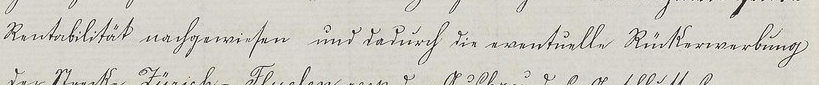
Rentabilität nachgewiesen und dadurch die eventuelle Rückerwerbung
